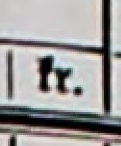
kr.
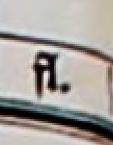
fl.
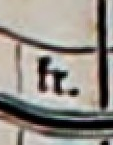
kr.
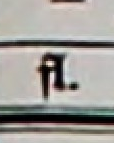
fl.
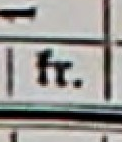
kr.
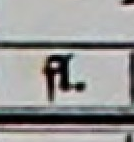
fl.
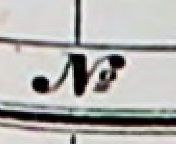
Nro.
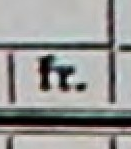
kr.
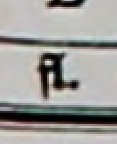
fl.
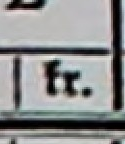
kr.
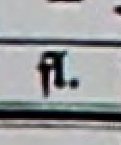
fl.
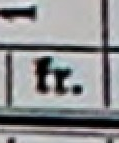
kr.
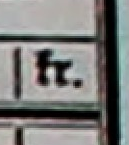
kr.
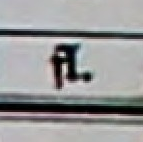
fl.
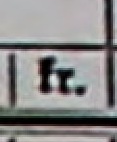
kr.
